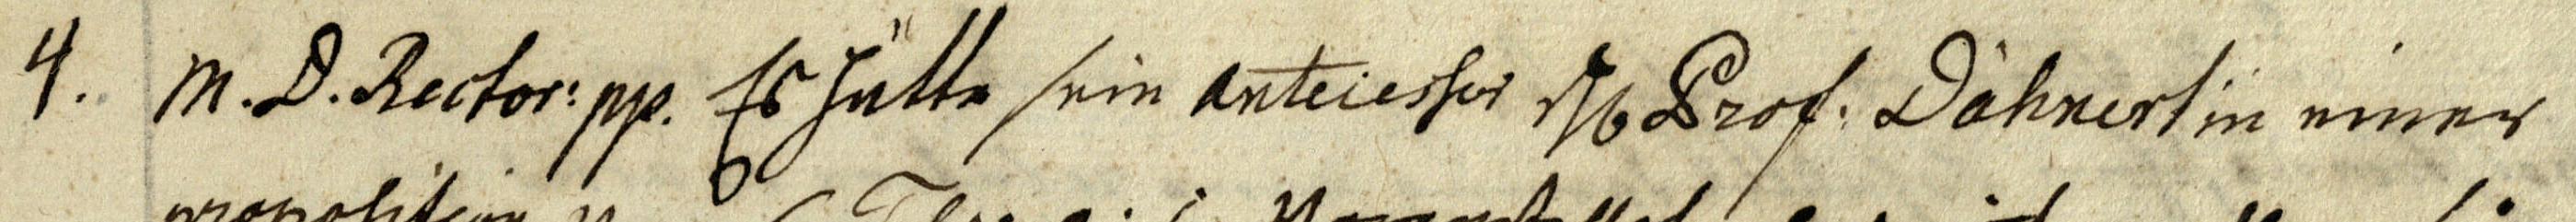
4. M. D. Rector pp. Es hätte sein Antecessor dh. Prof. Daehnert in einer
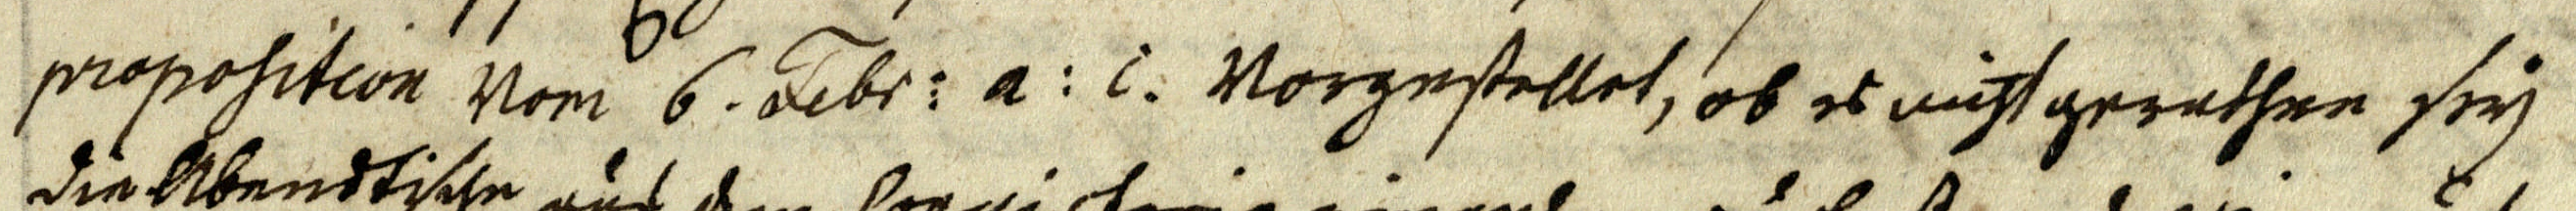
proposition vom 6. Febr. a. c. vorgestellet, ob es nicht gerathen seÿ,
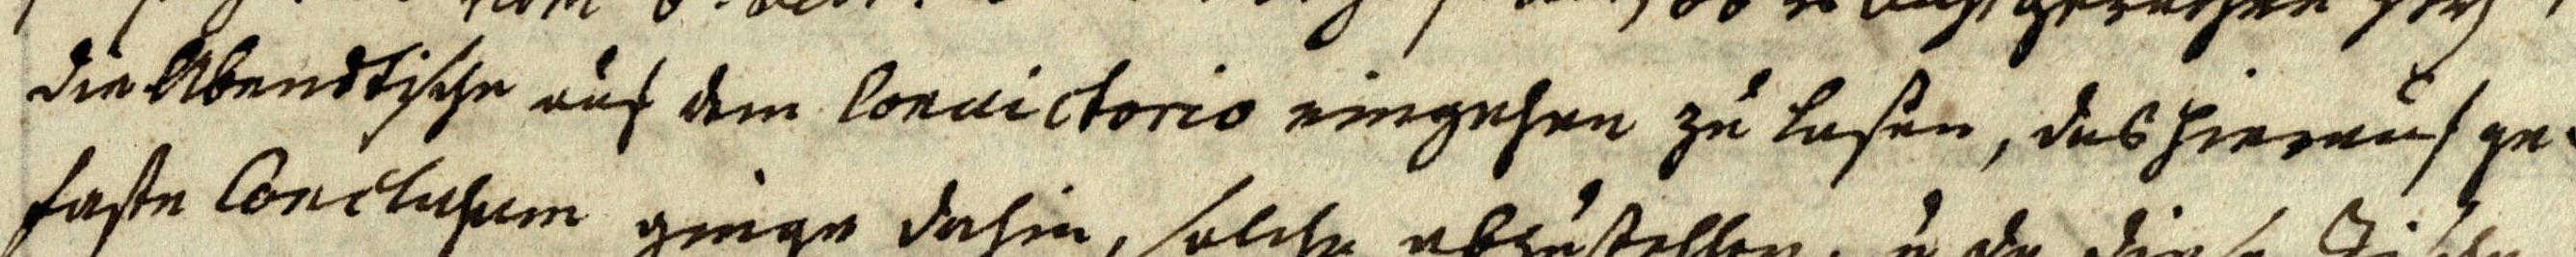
die Abendtische auf dem Convictorio eingehen zu laßen, das hierauf ge¬
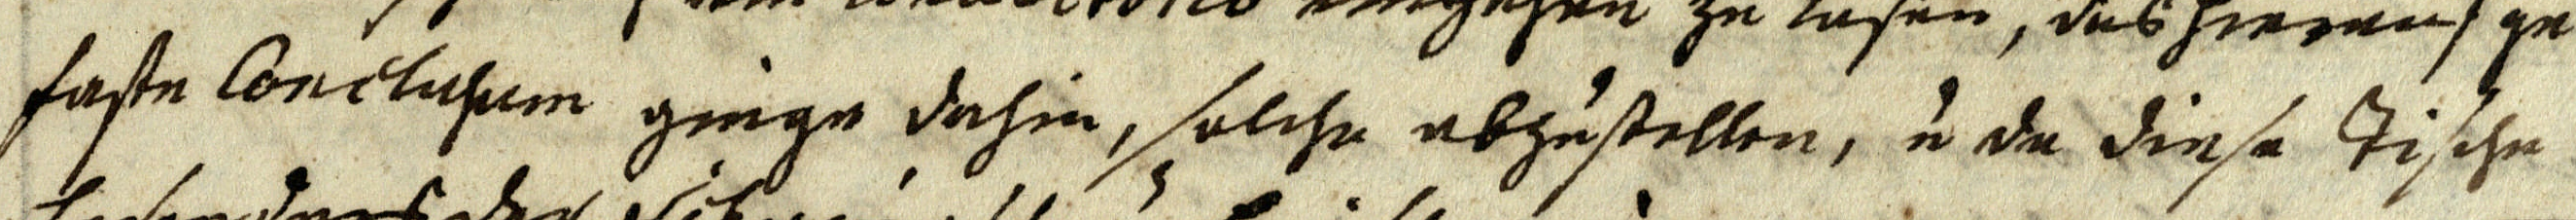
faste Conclusum ginge dahin, solche abzustellen, u da diese Tische
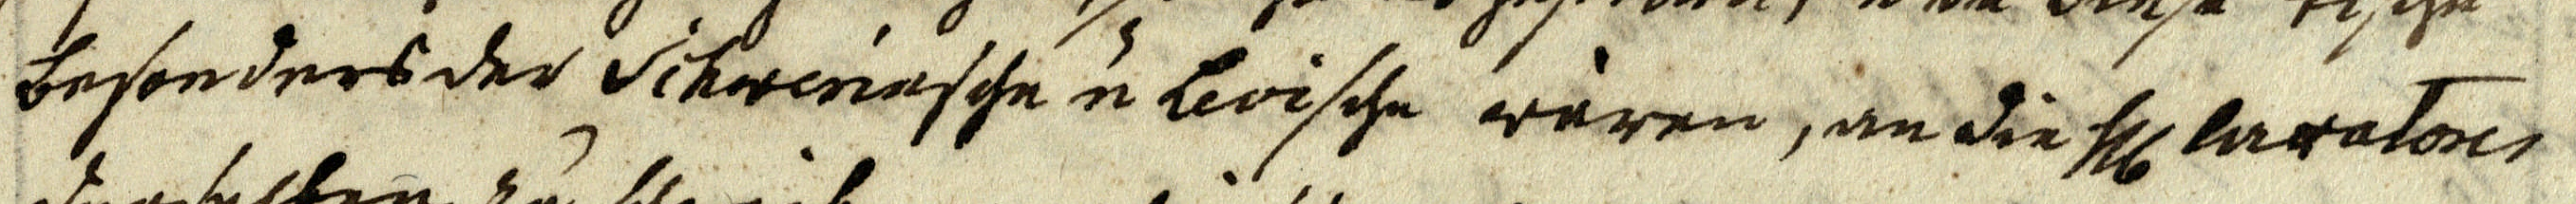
besonders der Schwerinsche und Levische wären, an die h. curatori
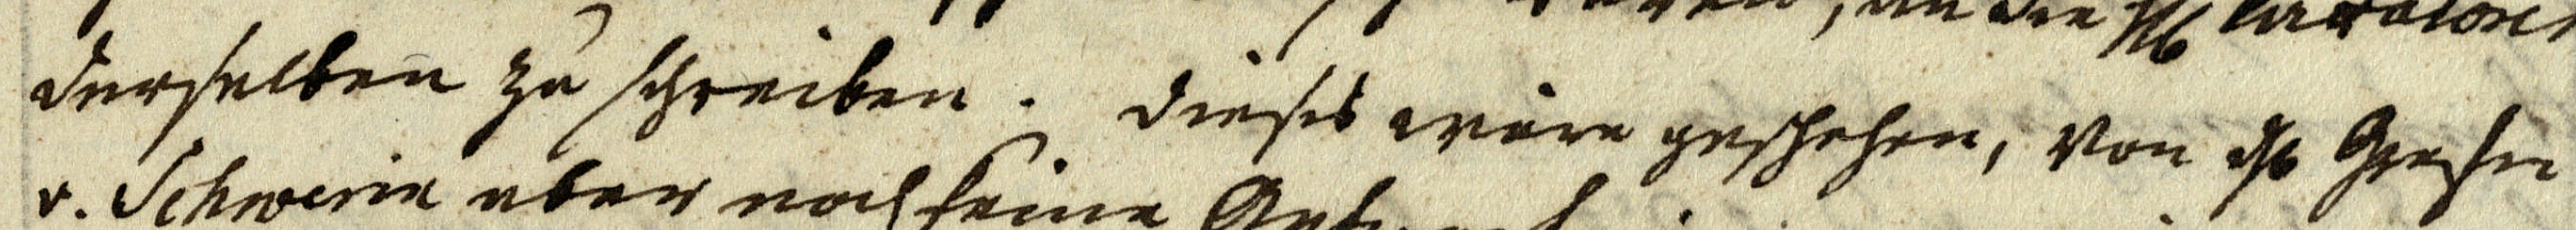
derselben zu schreiben. Dieses wäre geschehen, von dh. Grafen
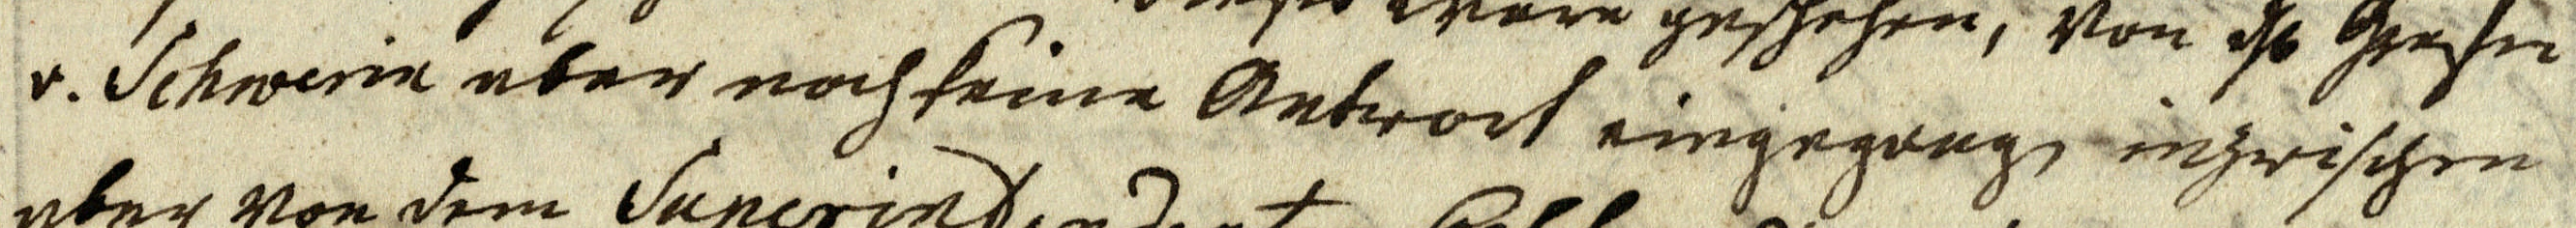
v. Schwerin aber noch keine Antwort eingegang inzwischen
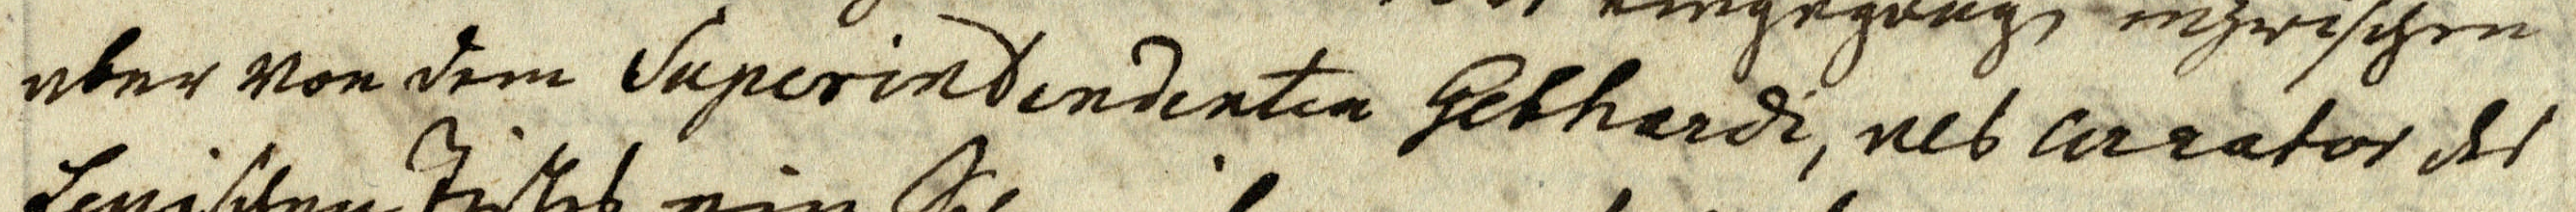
aber von dem Superintendenten Gebhardi, als curator des
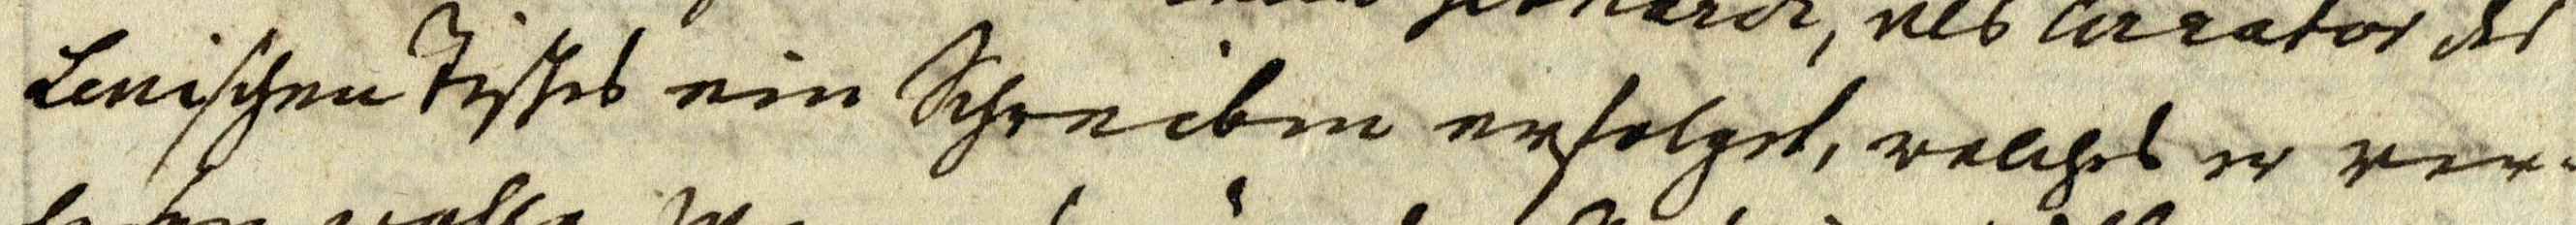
Levischen Tisches ein Schreiben erfolget, welches er ver¬
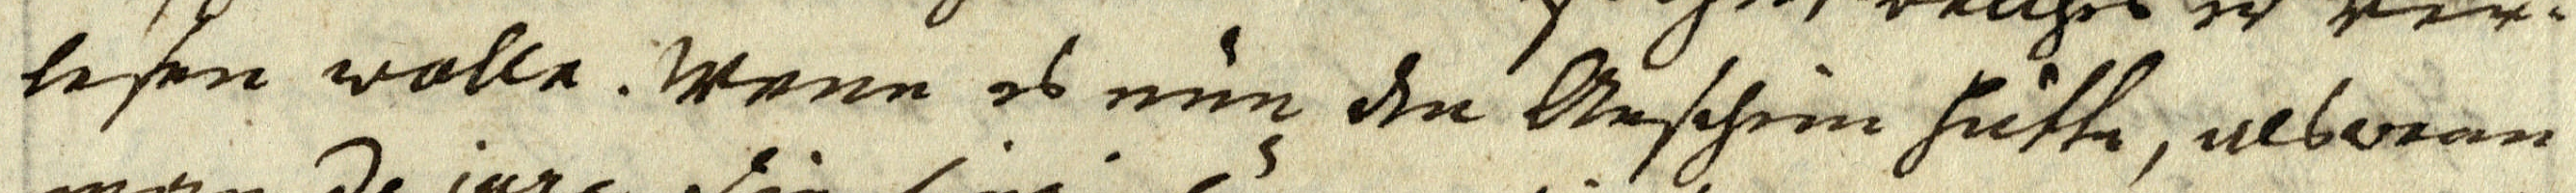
lesen wolle. Wenn es nun den Anschein hätte, alswenn
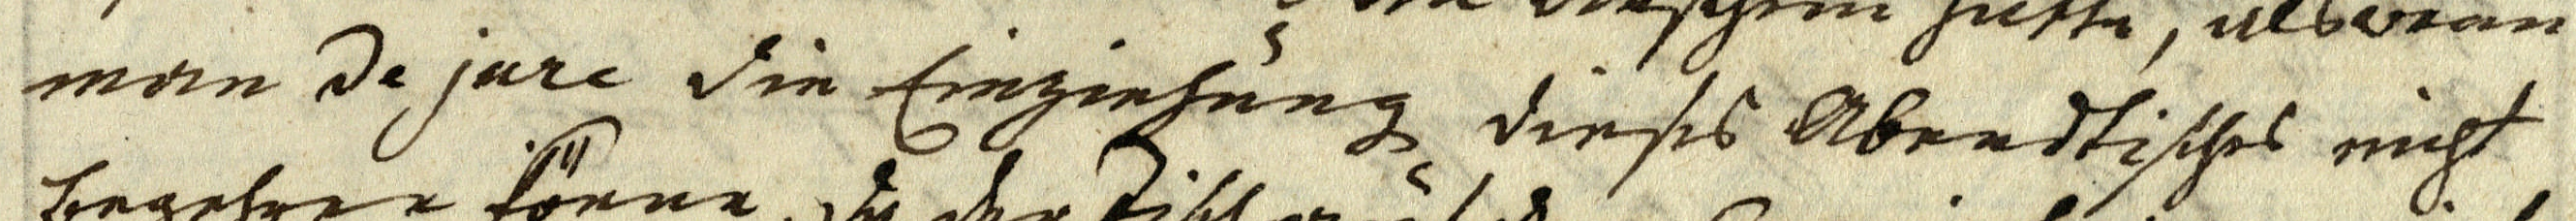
man de jure die Einziehung dieses Abendtisches nicht
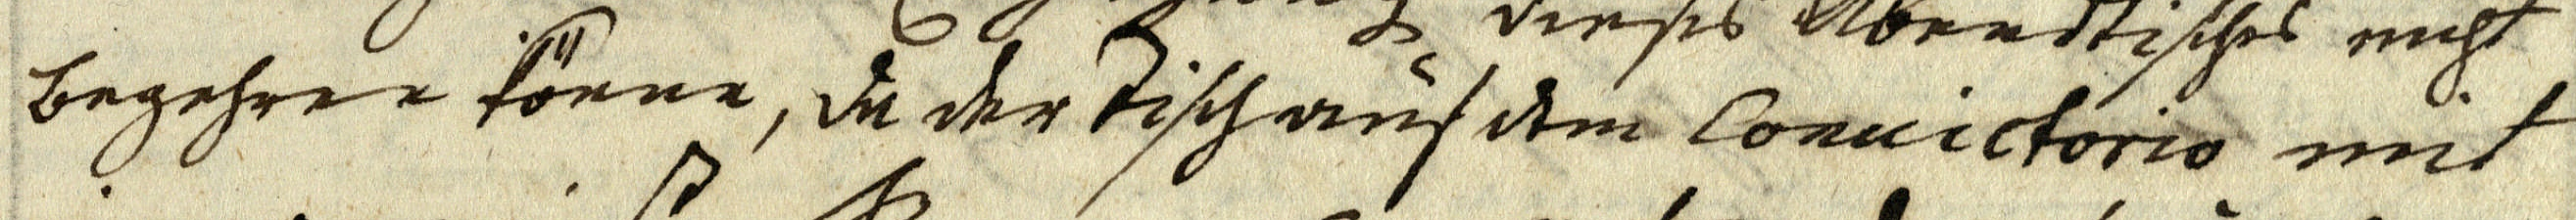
begehren könne,da der Tisch auf dem Convictorio mit
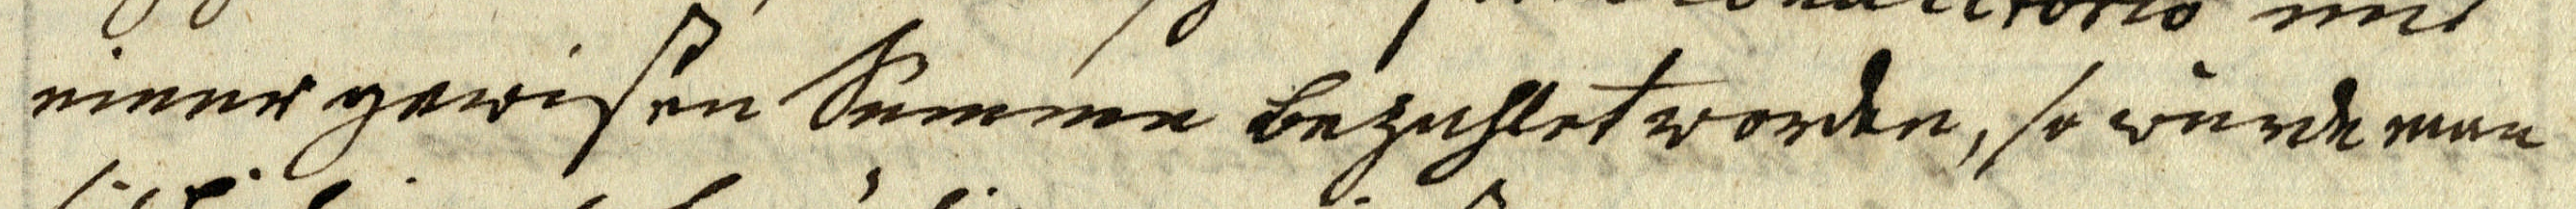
einer gewißen Summe bezahlet worden, so würde man
